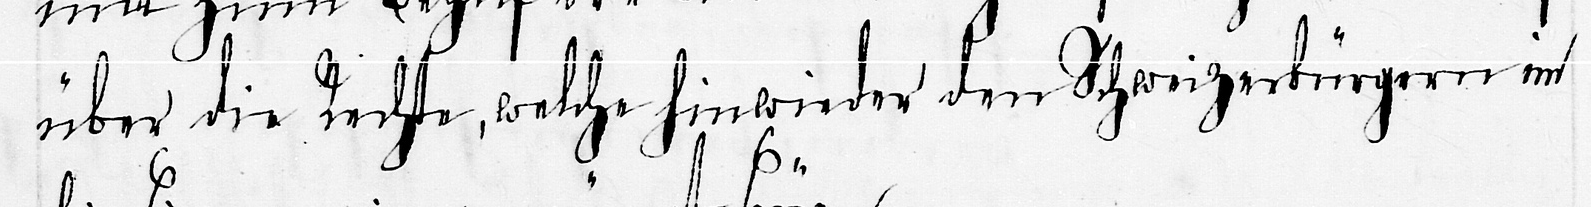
über die Rechte, welche hinwieder den Schweizerbürgern im
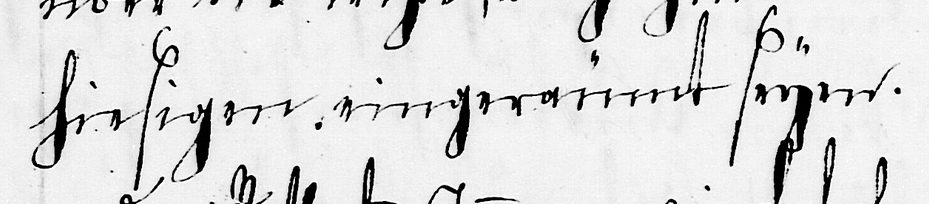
hiesigen eingeräumt seyen.
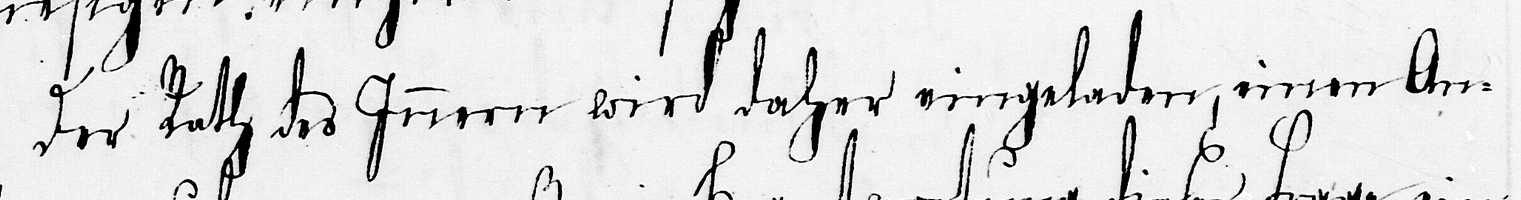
Der Rath des Innern wird daher eingeladen, einen An¬
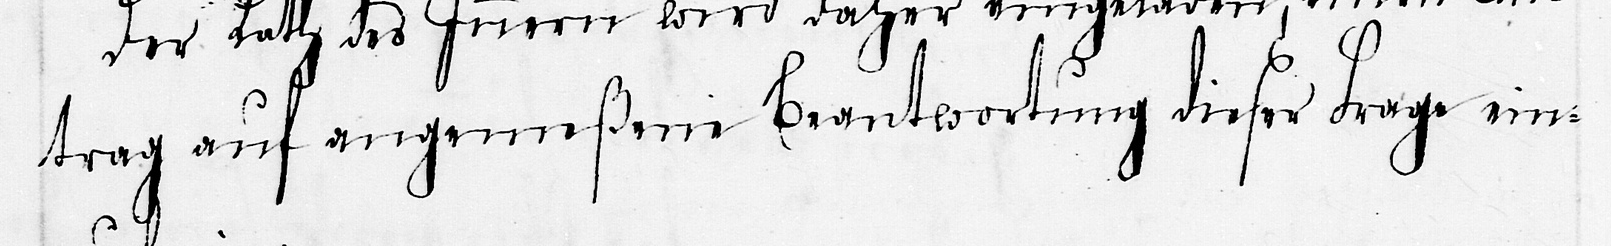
trag auf angemeßene Beantwortung dieser Frage ein¬
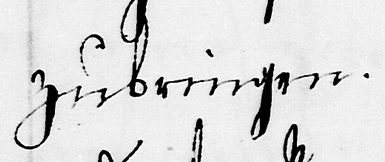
zubringen.
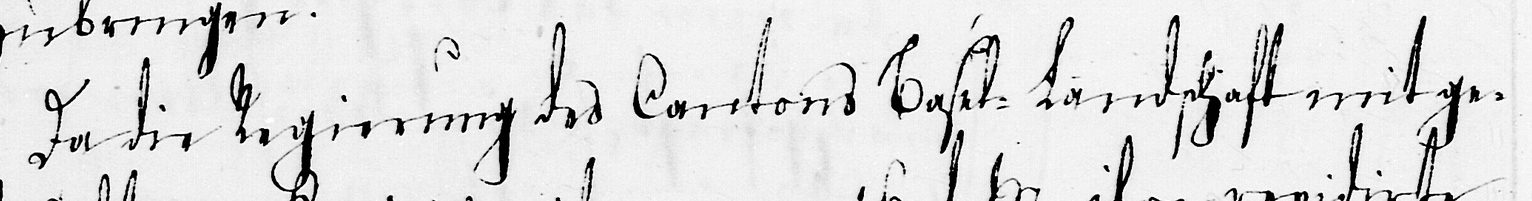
Da die Regierung des Cantons Basel-Landschaft mit ge¬
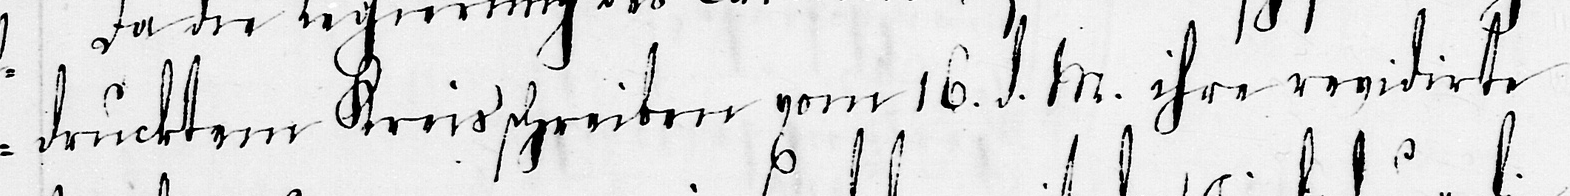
drucktem Kreisschreiben vom 16. d. M. ihre revidirte
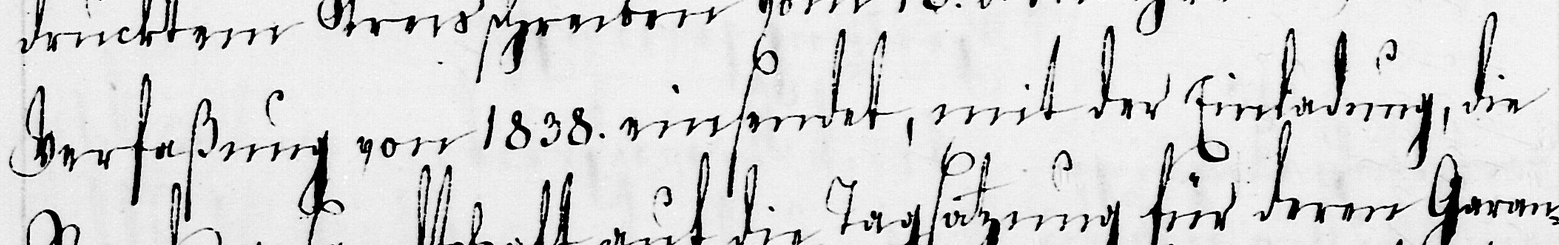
Verfaßung von 1838. einsendet, mit der Einladung, die
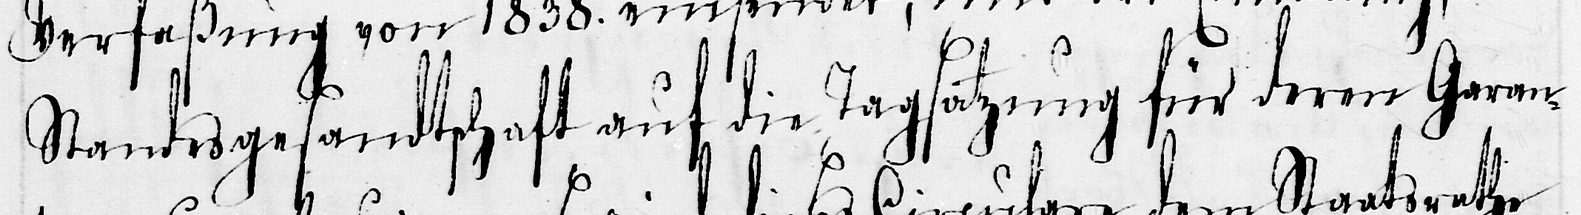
Standesgesandtschaft auf die Tagsatzung für deren Garan¬
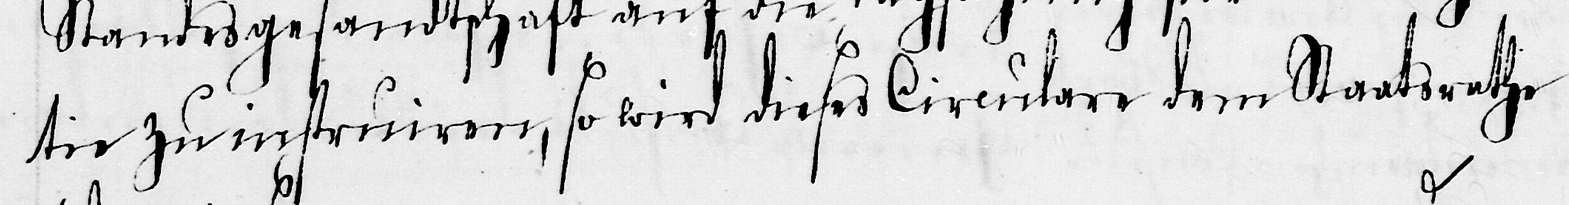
tie zu instruiren, so wird dieses Circulare dem Staatsrathe
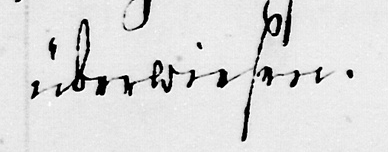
überwiesen.
